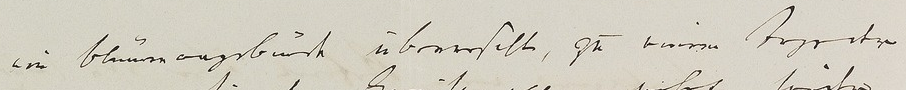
ein Blumenangebunde überrascht, zu einem Tage der
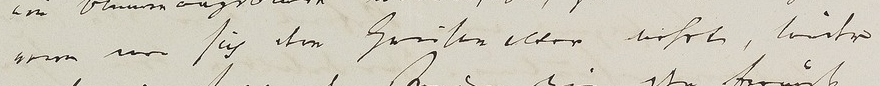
wenn man sich den Greisenalter nähert, leider
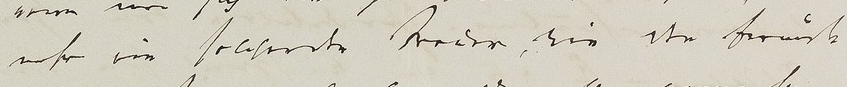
mehr ein solcher der Trauer, wie der Freude
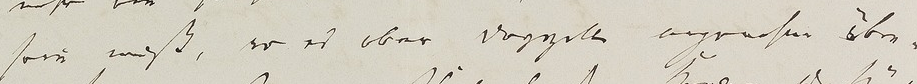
sein muß, wo es aber doppelt angenehm über-
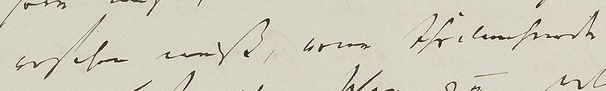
raschen muß, wenn theilnehmende
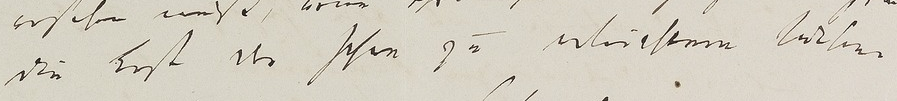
die Last der Jahre zu erleichtern suchen.
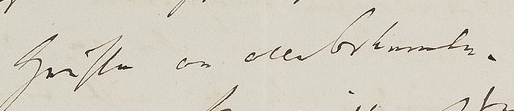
Grüsse an alle Bekannte.
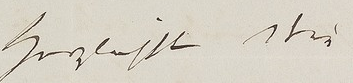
Herzlichst Dein
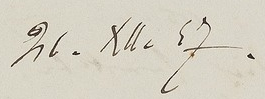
21. XII. 57.
